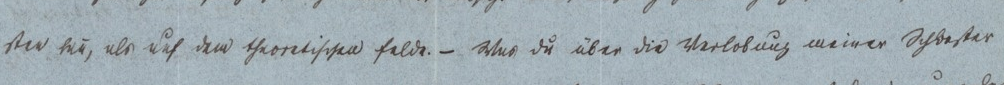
sten kann, als auf dem theoretischen Felde. – Was du über die Verlobung meiner Schwester
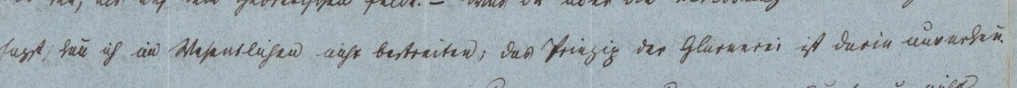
sagst, kann ich im Wesentlichen nicht bestreiten; das Prinzip der Glarnerei ist darin unverkenn-
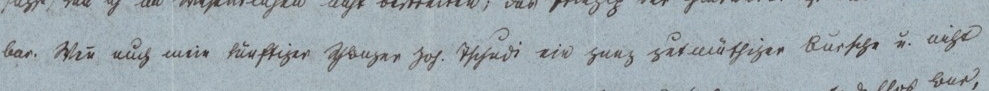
bar. Wenn auch mein künftiger Schwager Joh. Tschudi ein ganz gutmüthiger Bursche u. nicht
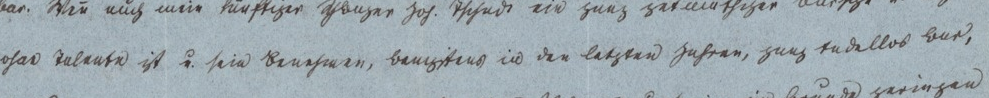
ohne Talente ist u. sein Benehmen, wenigstens in den letzten Jahren, ganz tadellos war,
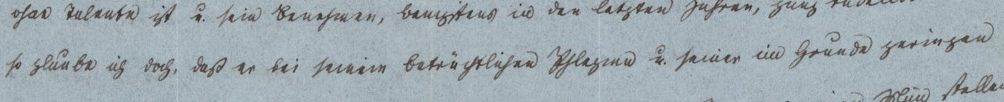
so glaube ich doch, daß er bei seinem beträchtlichen Phlegma u. seiner im Grunde geringen
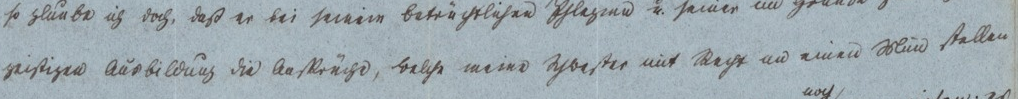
geistigen Ausbildung die Ansprüche, welche meine Schwester mit Recht an einen Mann stellen
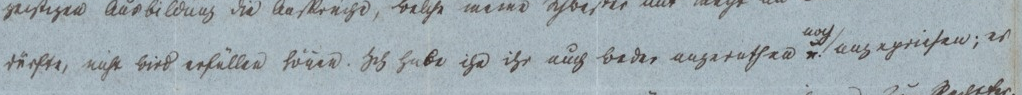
dürfte, nicht wird erfüllen können. Ich habe ihn ihr auch weder angerathen u.noch angepriesen; es
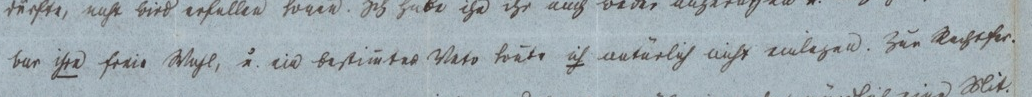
war ihre freie Wahl, u. ein bestimmtes Veto konnte ich natürlich nicht einlegen. Zur Rechtfer-
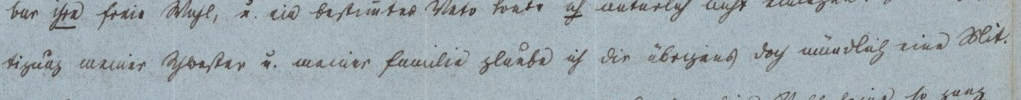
tigung meiner Schwester u. meiner Familie glaube ich dir übrigens doch mündlich eine Mit-
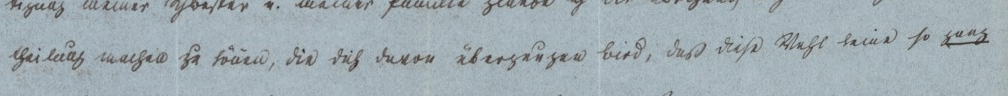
theilung machen zu können, die dich davon überzeugen wird, daß diese Wahl keine so ganz
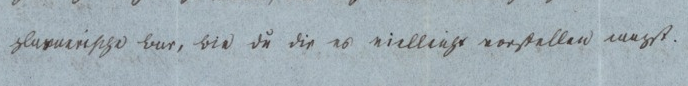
glarnerische war, wie du dir es vielleicht vorstellen magst.
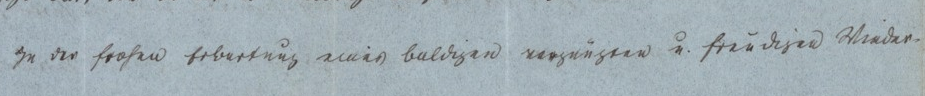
In der frohen Erwartung eines baldigen vergnügten u. freudigen Wieder-
